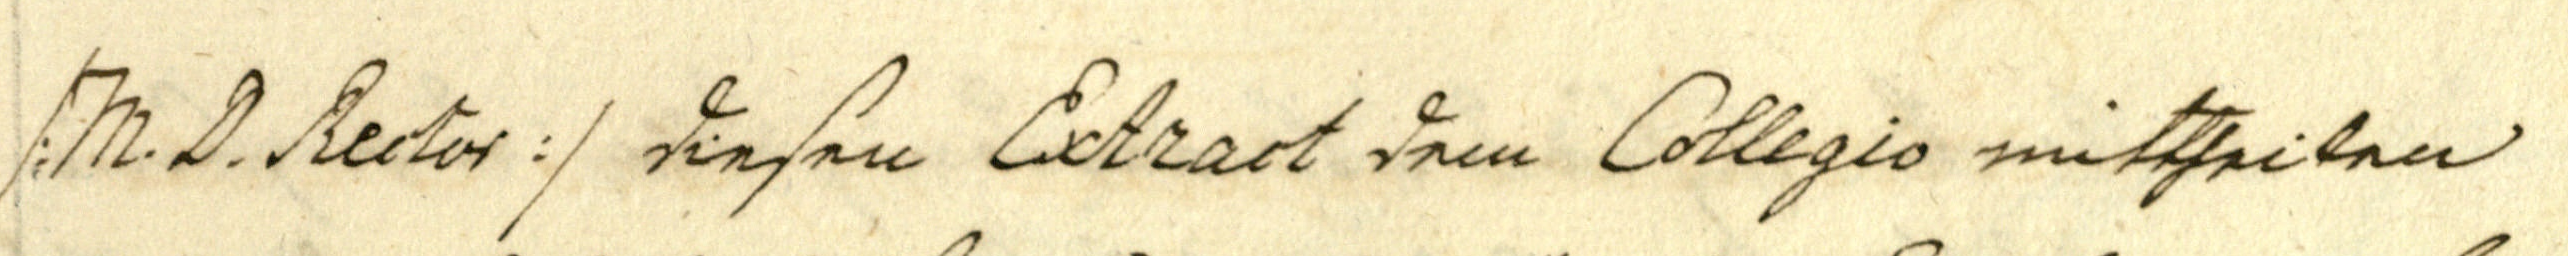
/: M. D. Rector :/ diesen Extract dem Collegio mittheilen
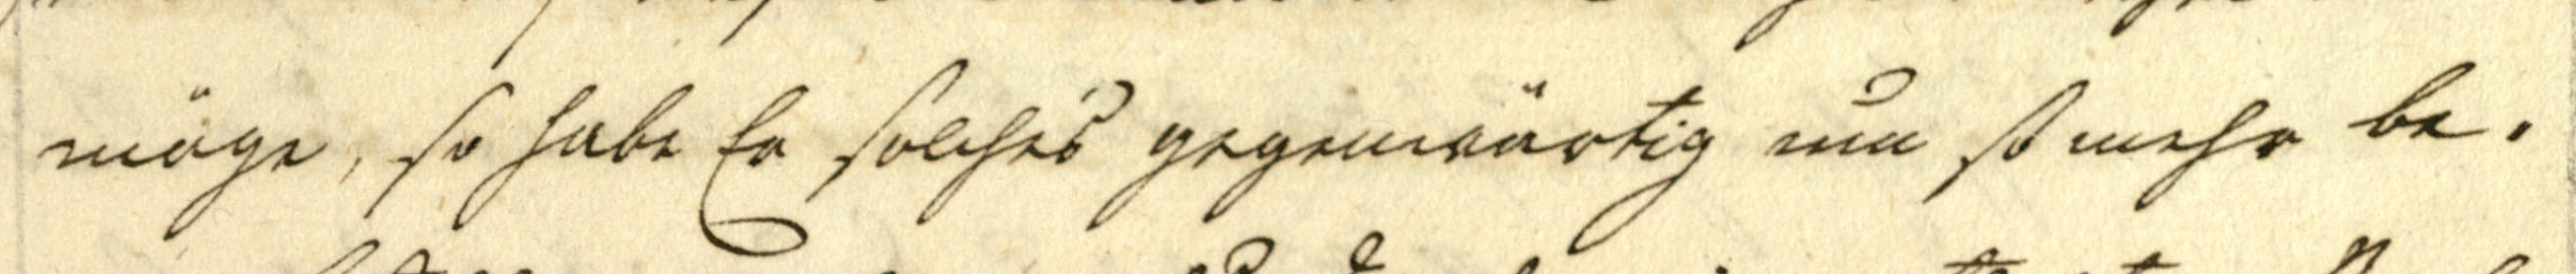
möge, so habe Er solches gegenwärtig um so mehr be¬
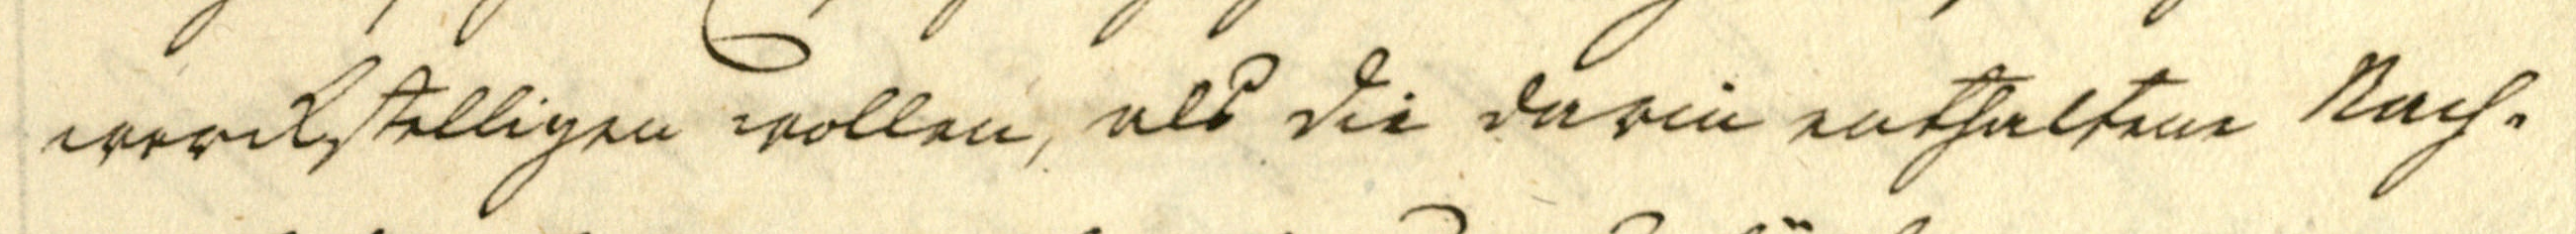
werckstelligen wollen, als die darin enthaltene Nach¬
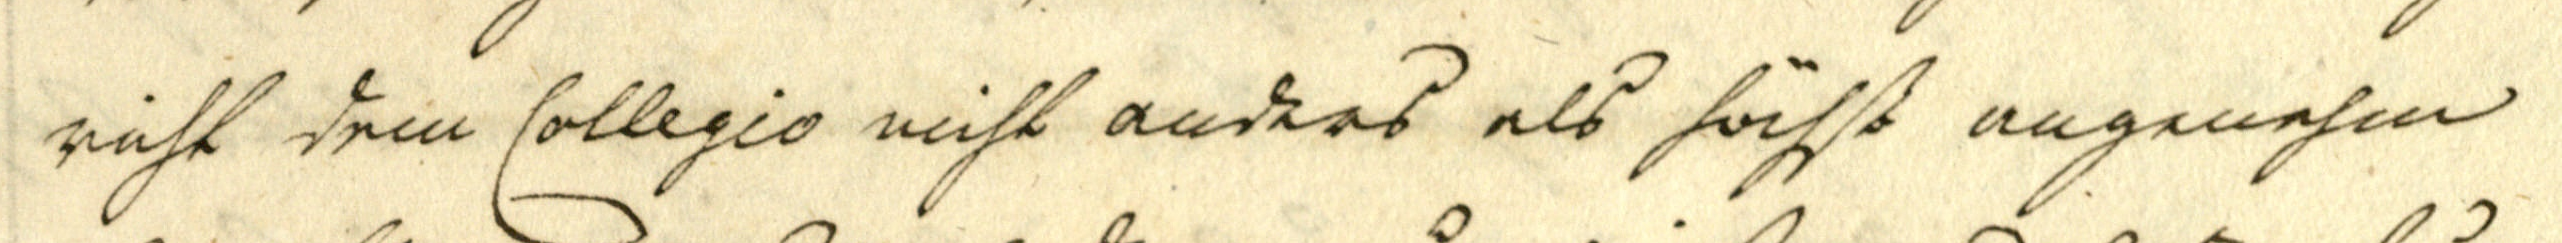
richt dem Collegio nicht anders als höchst angenehm
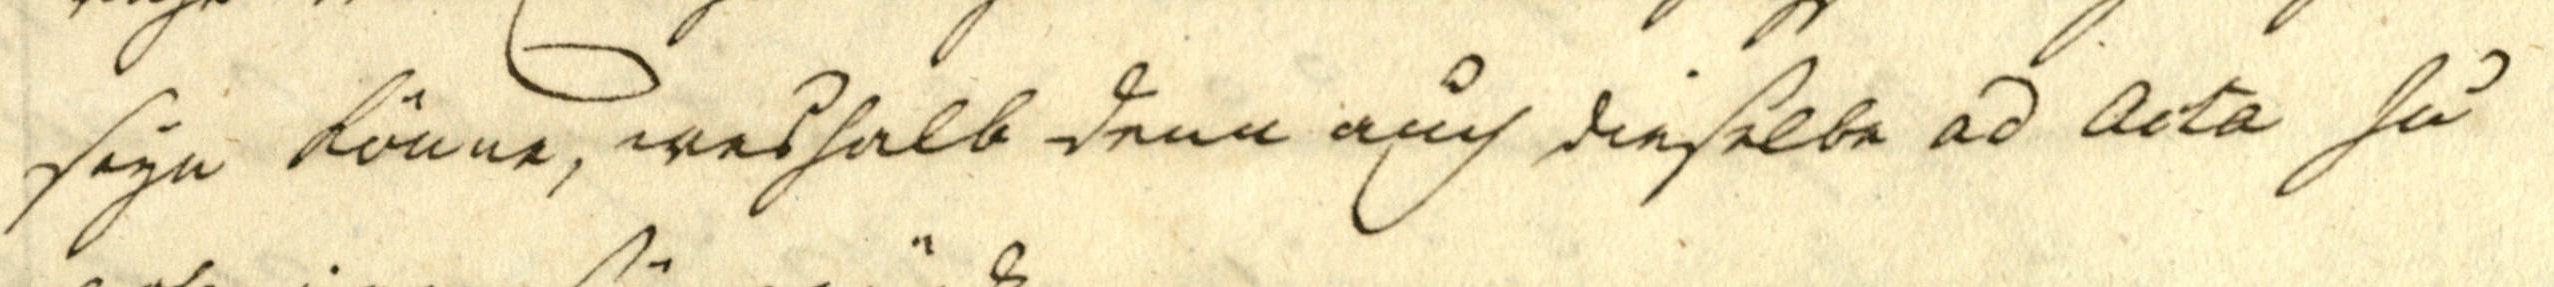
seyn könne, weshalb denn auch dieselbe ad Acta zu
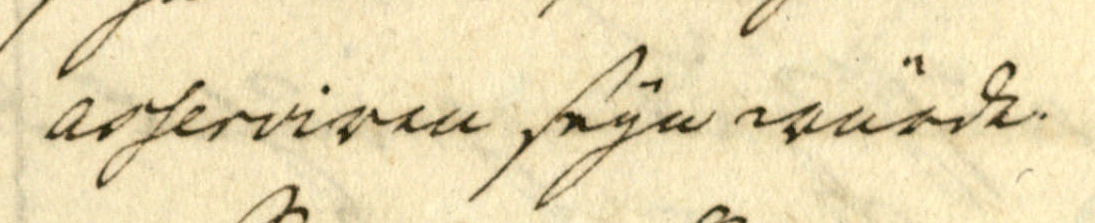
asserviren seÿn würde.
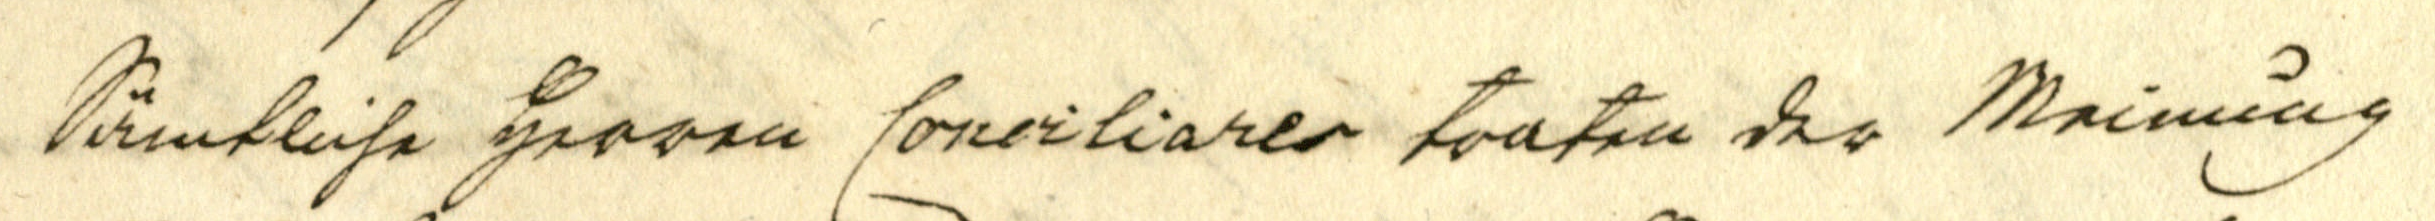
Sämtliche Herren Conciliares traten der Meinung
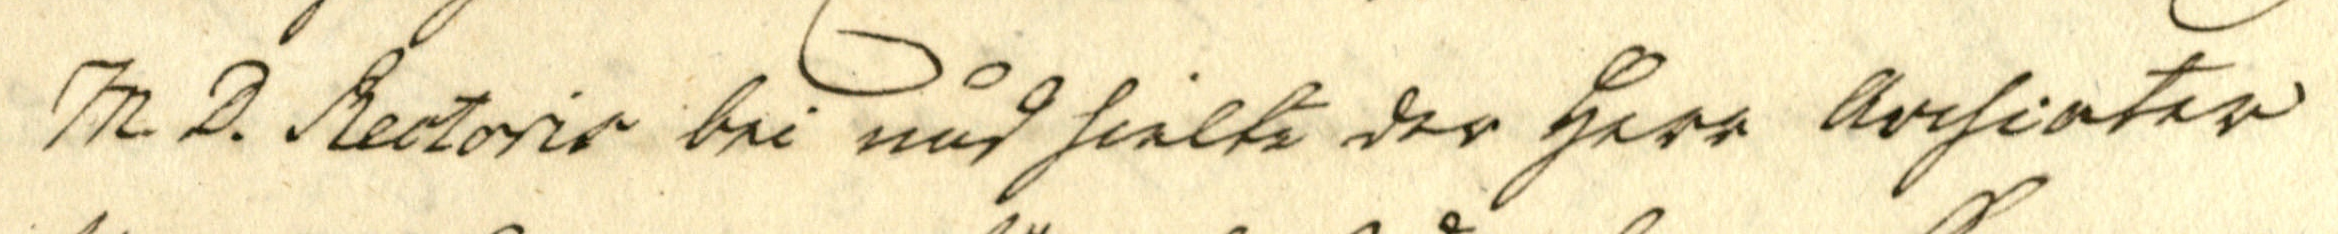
M. D. Rectoris bei und hielte der Herr Archiater
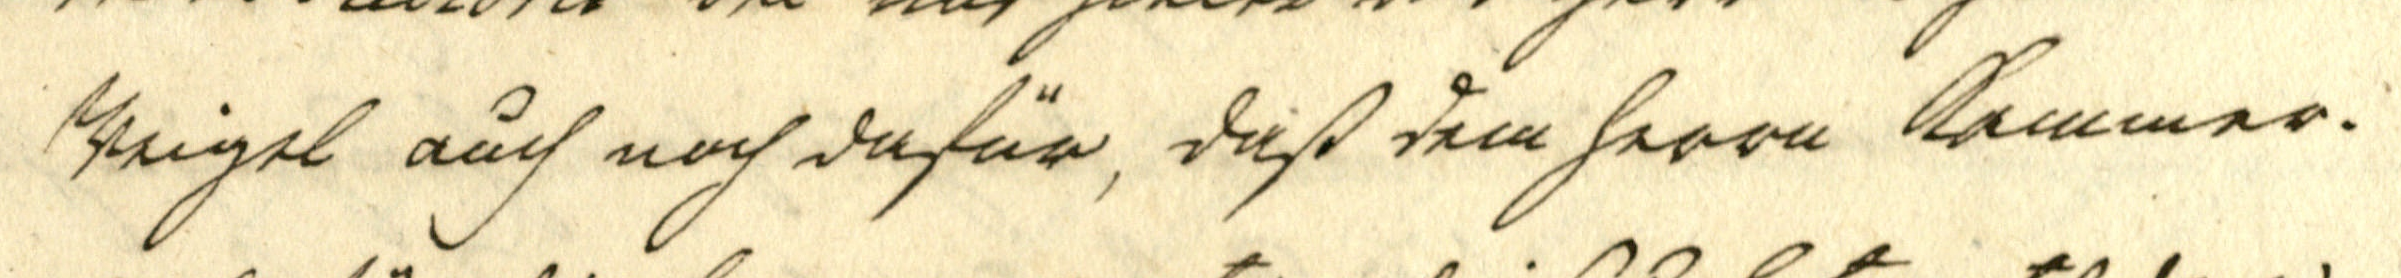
Weigel auch noch dafür, daß dem Herrn Kammer¬
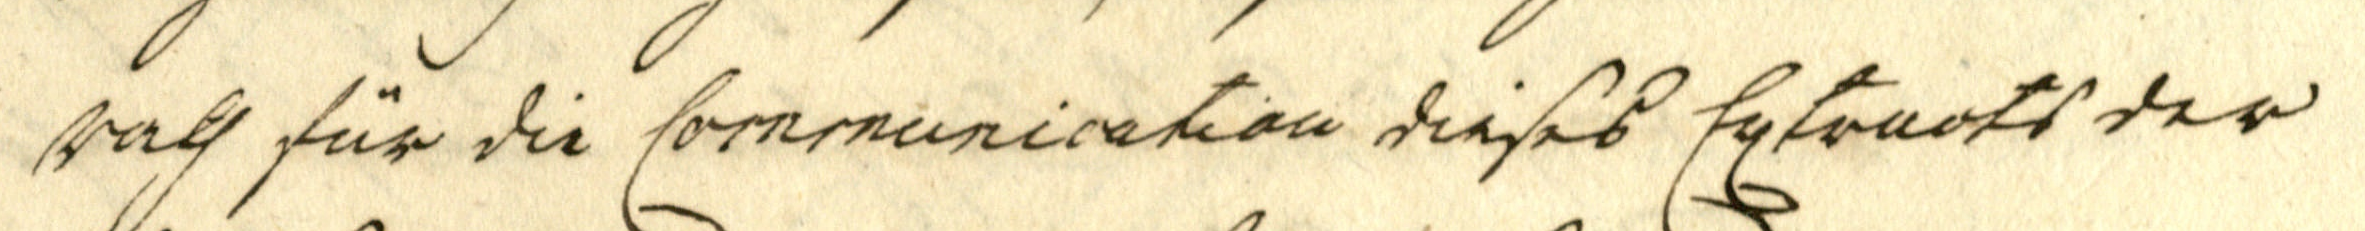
rath für die Communication dieses Extracts der
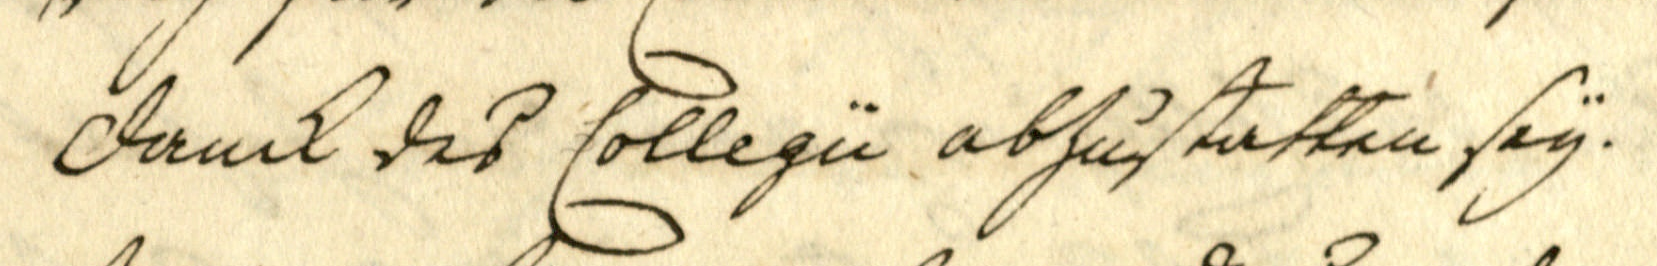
Danck des Collegii abzustatten seÿ.
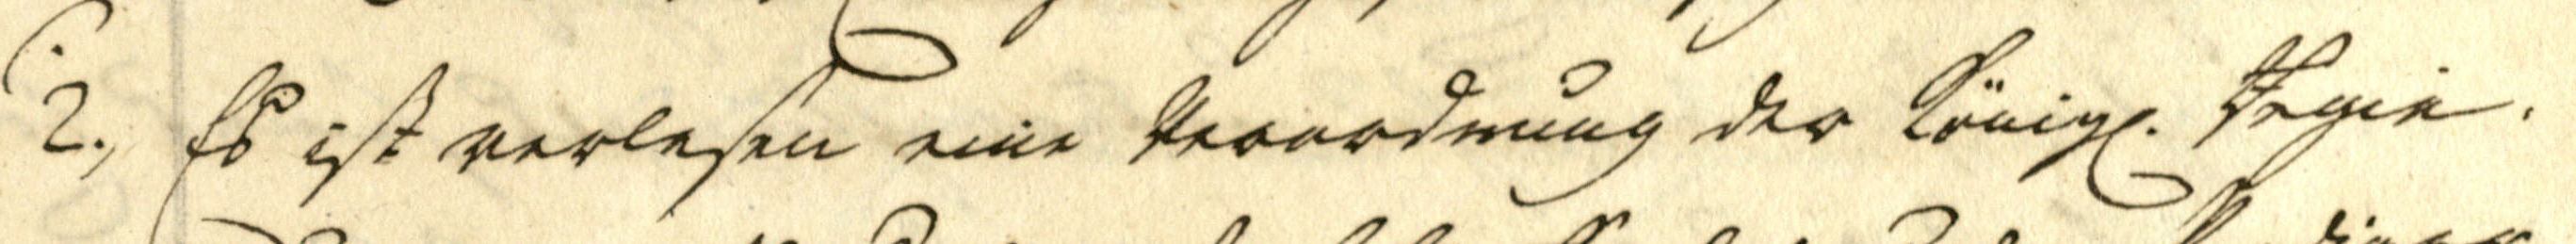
2., Es ist verlesen eine Verordnung der Königl. Regie¬
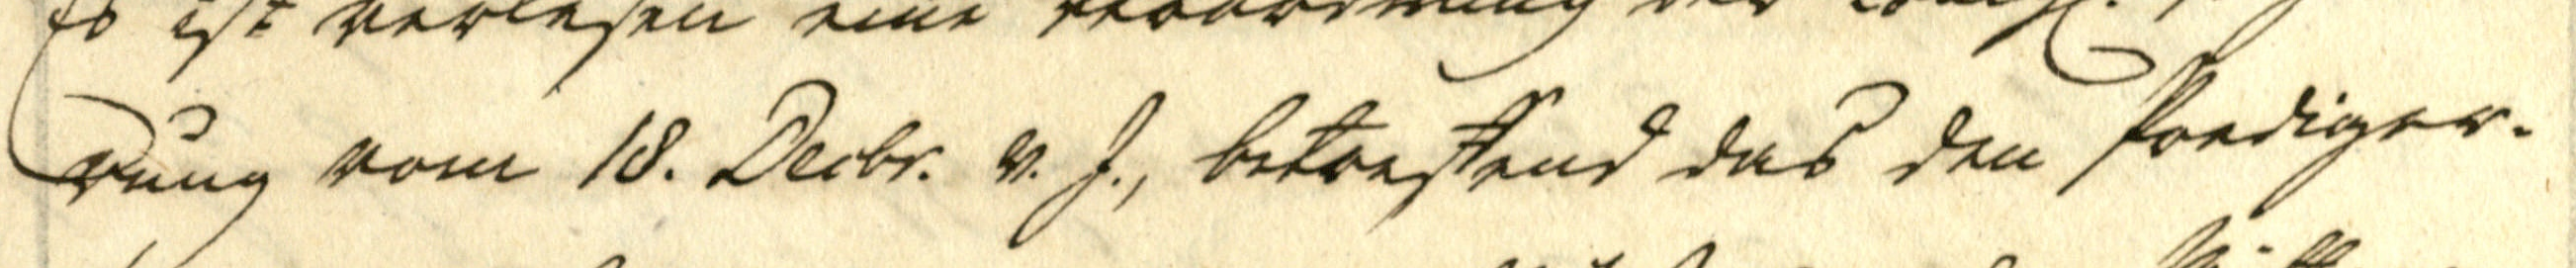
rung vom 18. Decbr. v. J., betreffend das den Prediger¬
